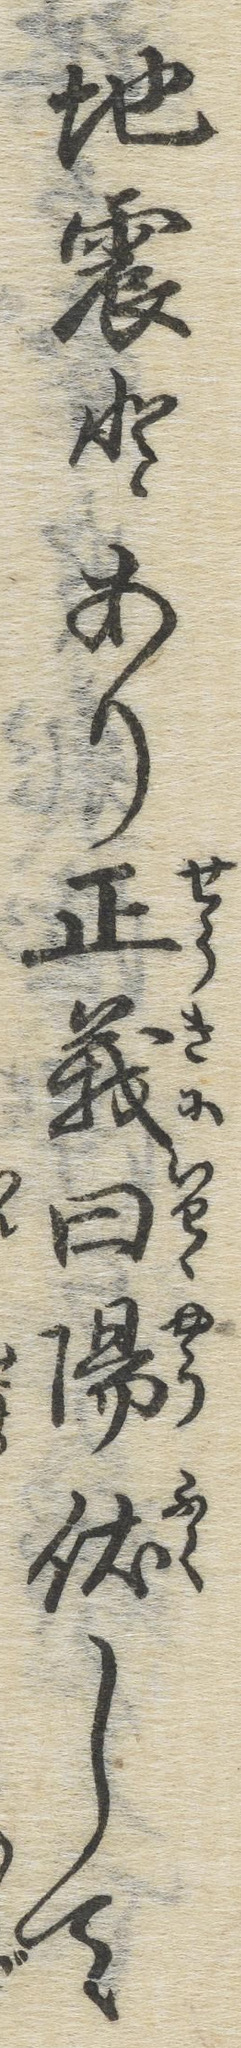地震とあり正義曰陽伏して
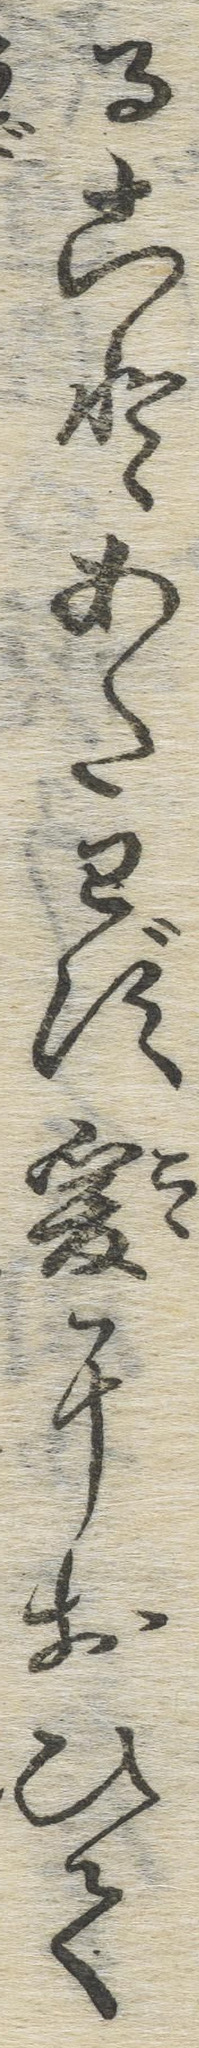ることあたわず爰におひて
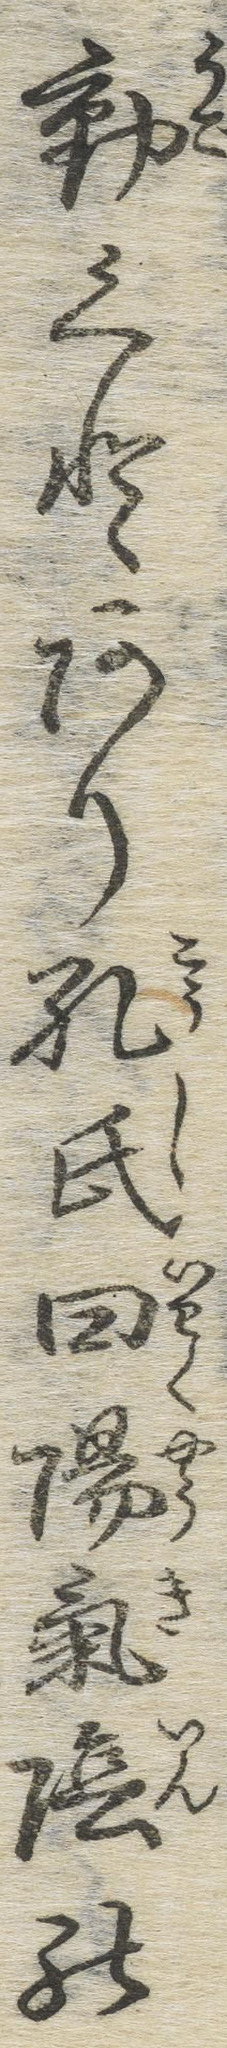動くとあり孔氏曰陽気陰の
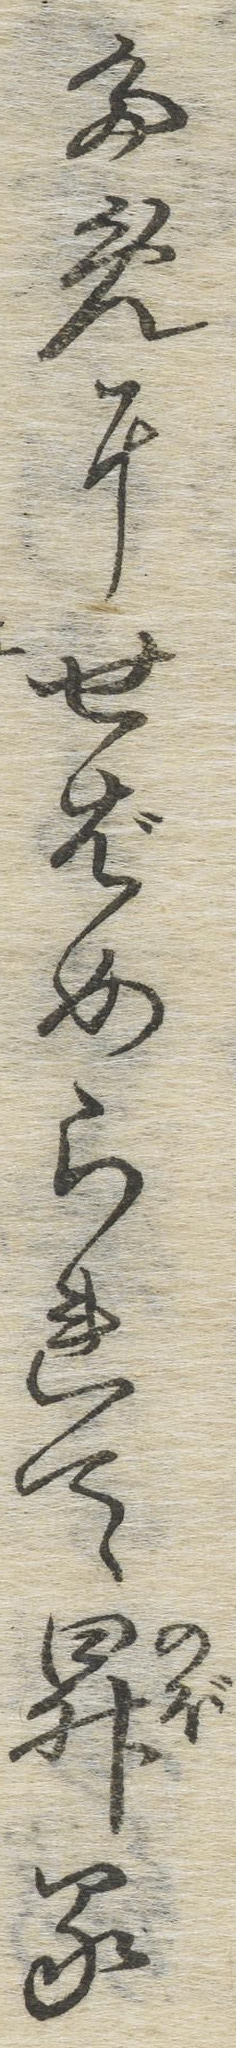ためにせばめられて昇る
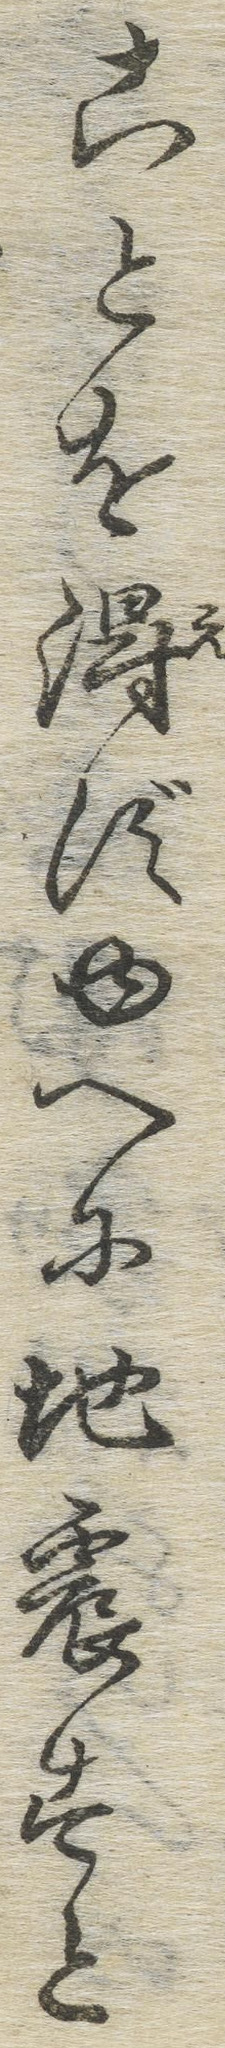ことを得ずゆへに地震すと
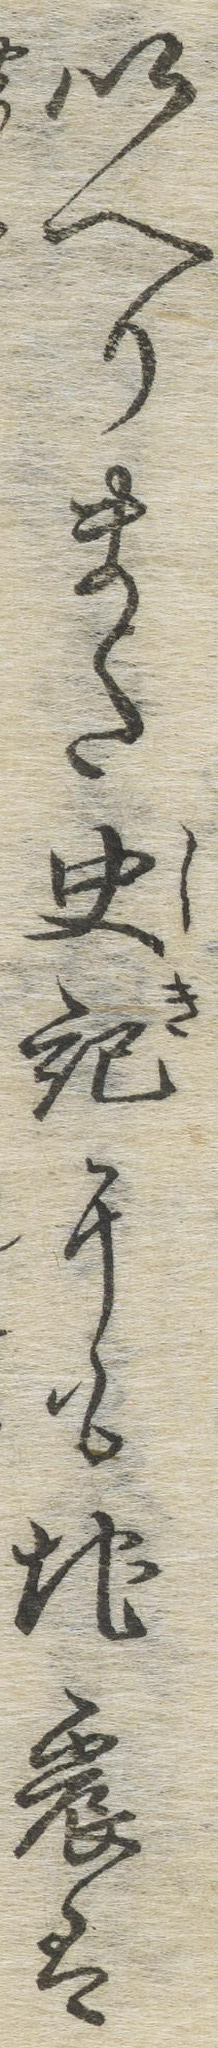いへりまた史記にも地震は
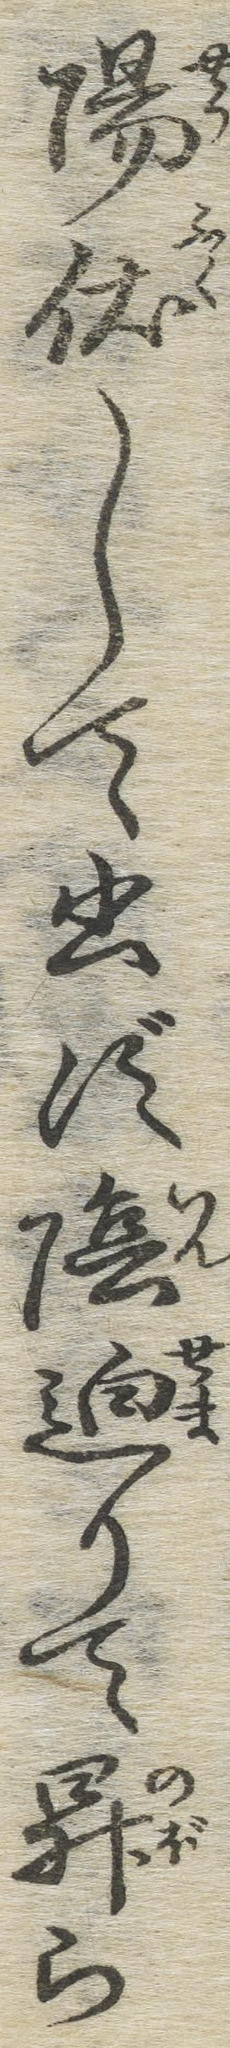陽伏して出ず陰迫りて昇ら

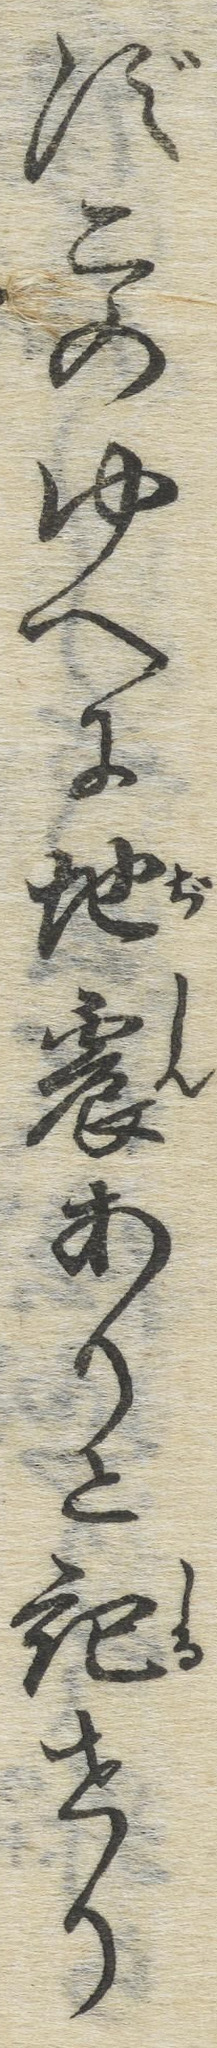ずこのゆへに地震ありと記せり
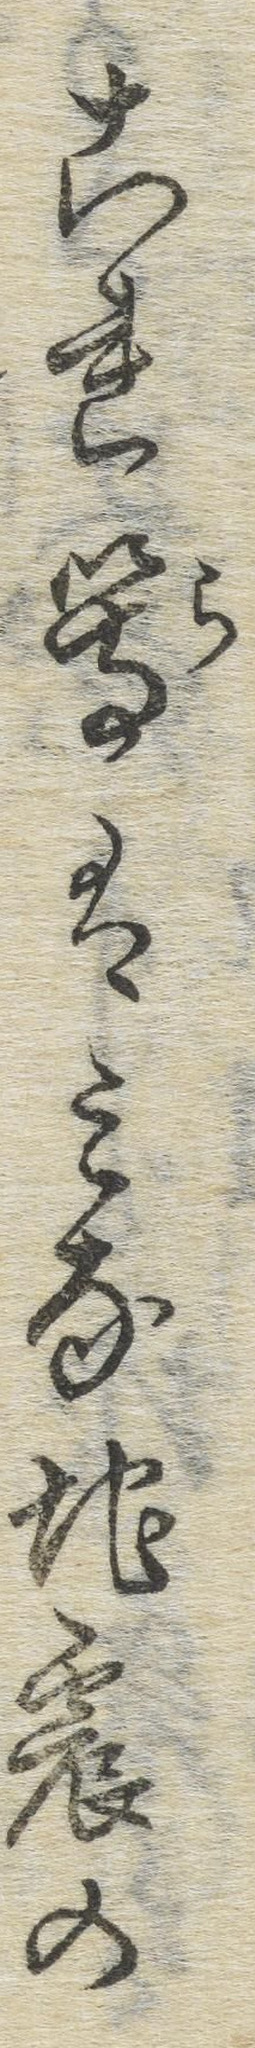これ等はみな地震の
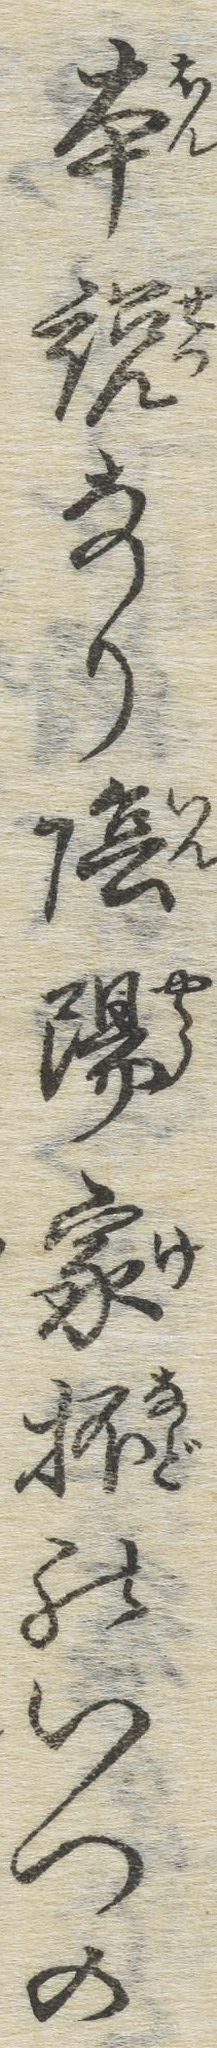本説なり陰陽家抔のいつの
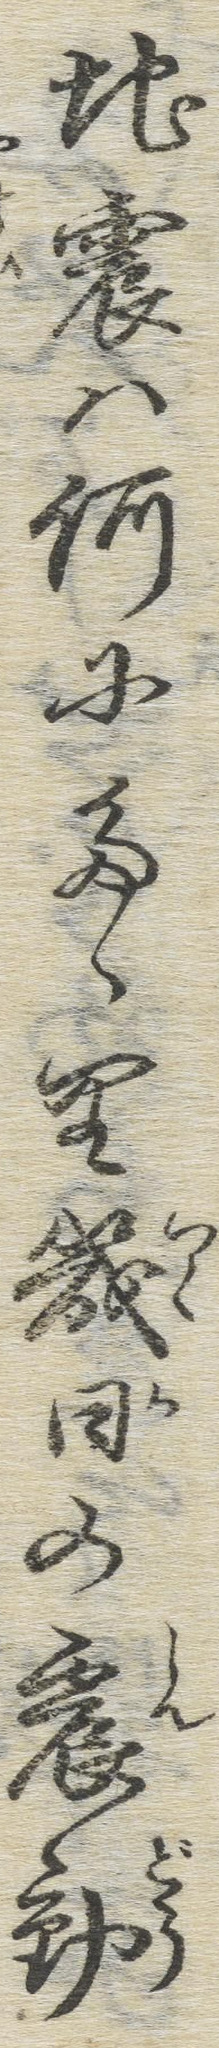地震は何にたゝり幾日の震動
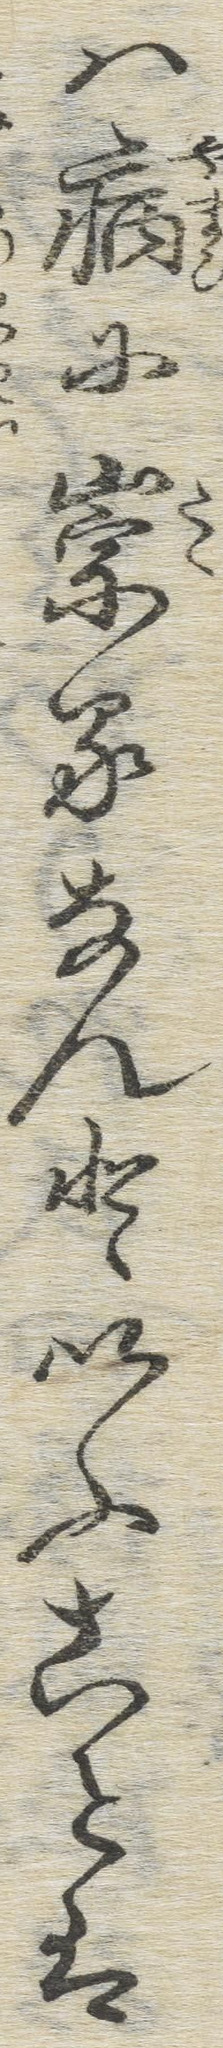は病に祟るなんといふことは
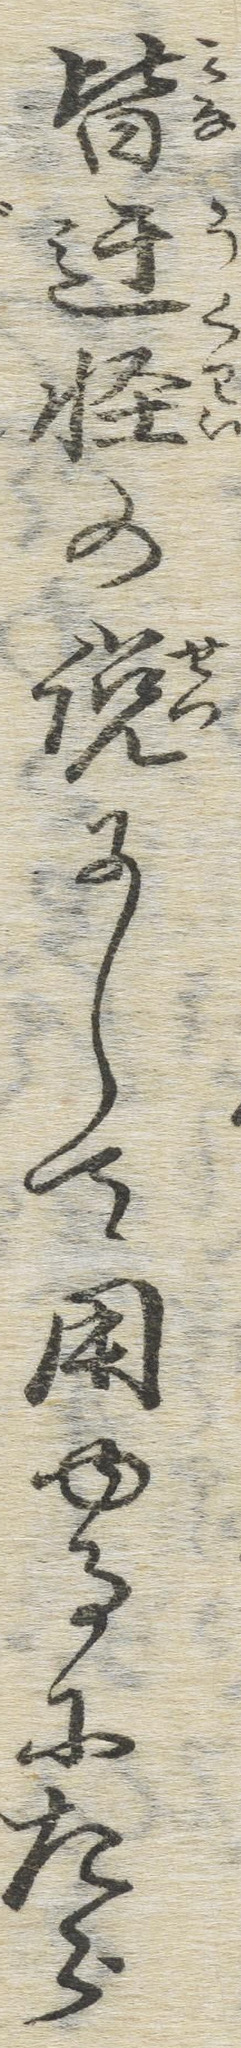皆迂怪の説にして用ゆるにたら
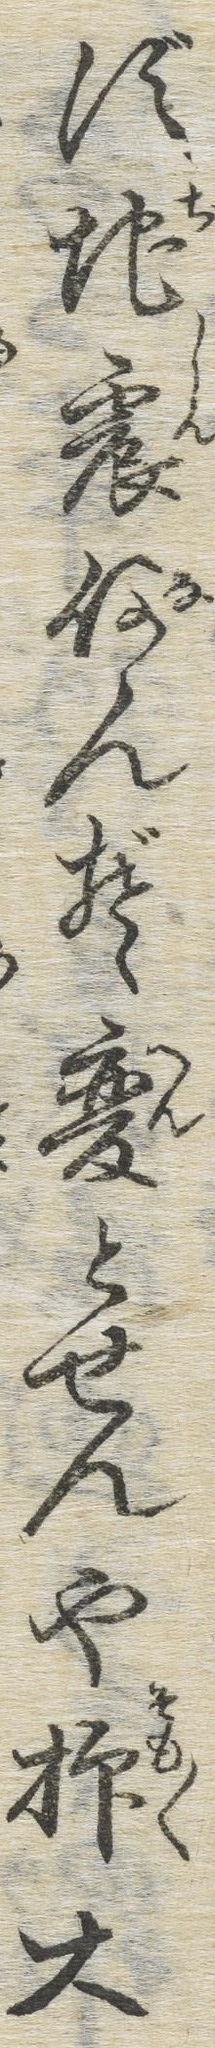ず地震何んぞ変とせんや抑大
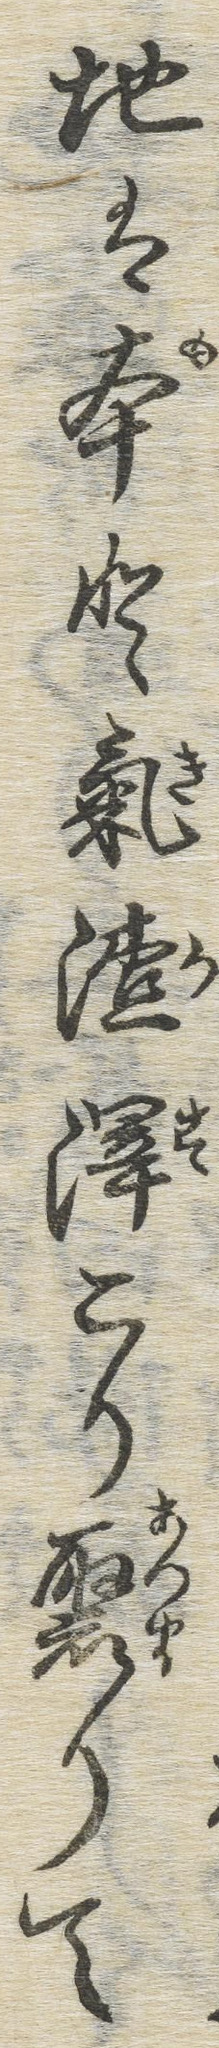地は本と気渣滓こり聚りて
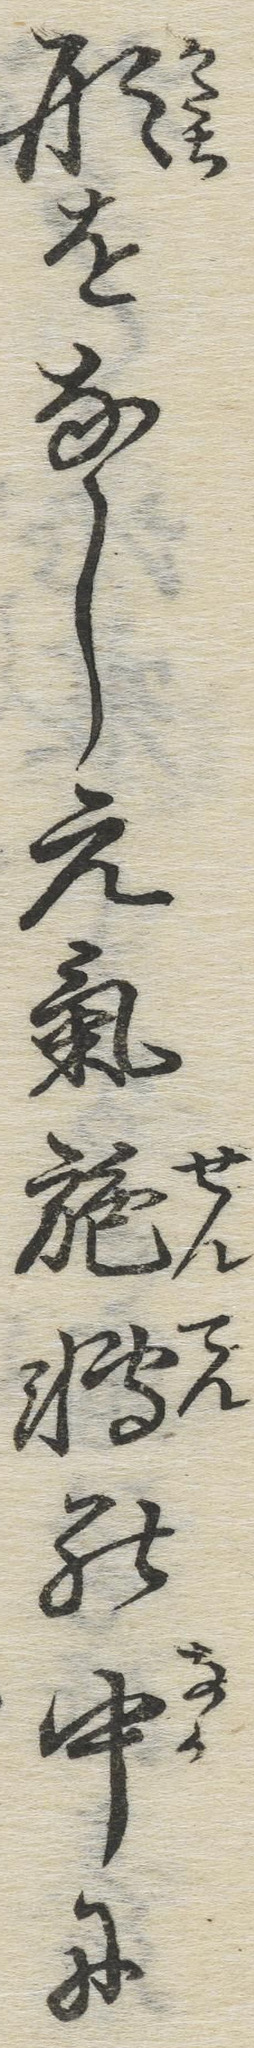形をなし元気旋轉の中に
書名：雷公地震由來記　全
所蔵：東京大学地震研究所図書室 Earthquake Research Institute Library, The University of Tokyo, JAPAN
